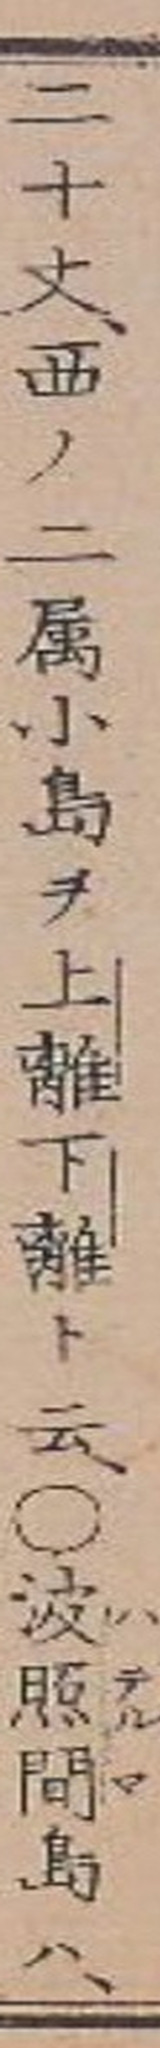二十丈、西ノ二属小島ヲ上離下離ト云、○波照間島ハ、
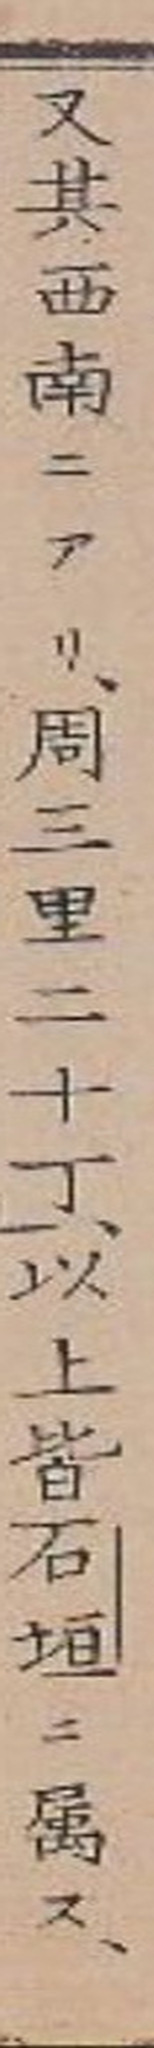又其西南ニアリ、周三里二十丁、」以上皆石垣ニ属ス、
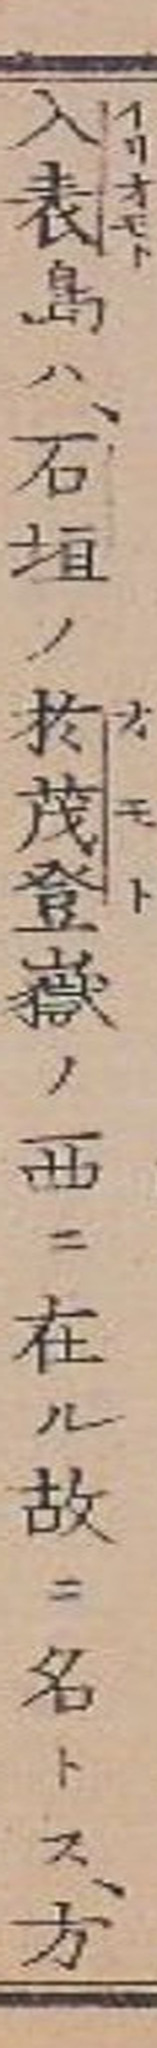入表島ハ、石垣ノ於茂登岳ノ西ニ在ル故ニ名トス、方
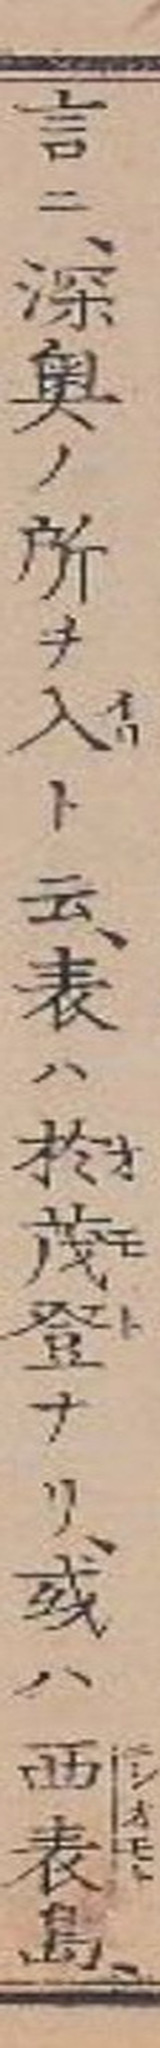言ニ、深奥ノ所ヲ入ト云、表ハ於茂登ナリ、或ハ西表島、
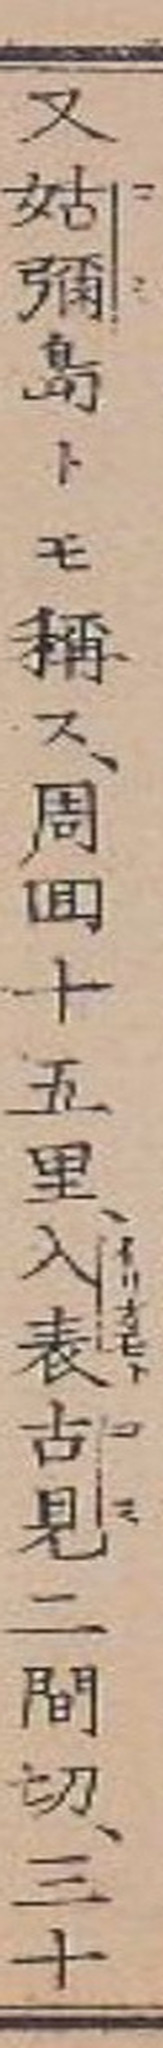又姑弥島トモ称ス、周回十五里、入表古見二間切、三十
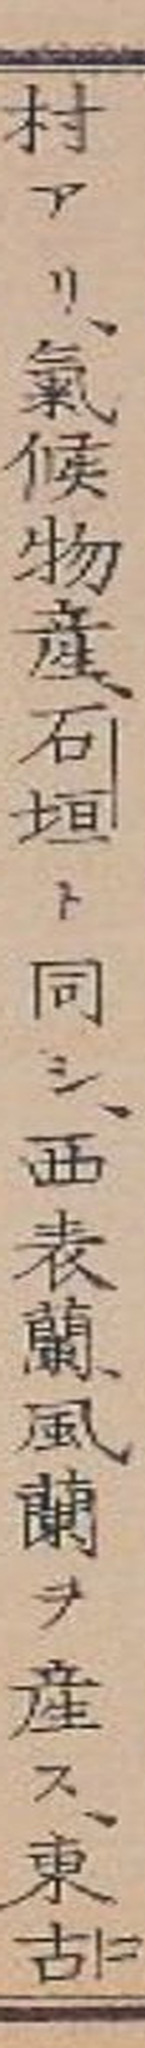村アリ、気候物産、石垣ト同シ、西表蘭、風蘭ヲ産ス、東古
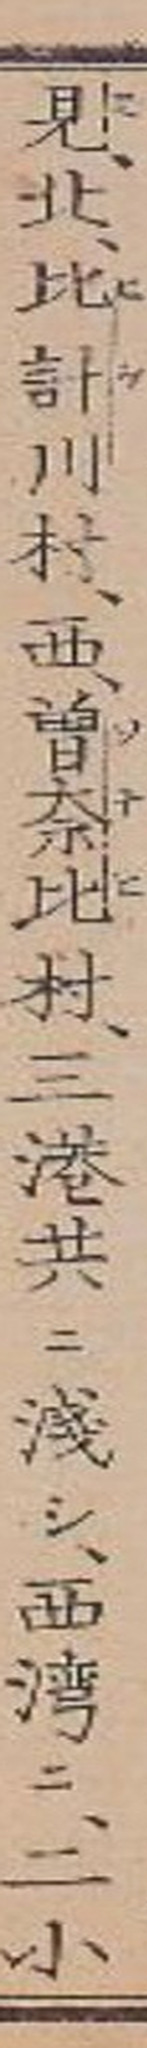見、北、比計川村、西、曽奈比村、三港共ニ浅シ、西湾ニ、二小
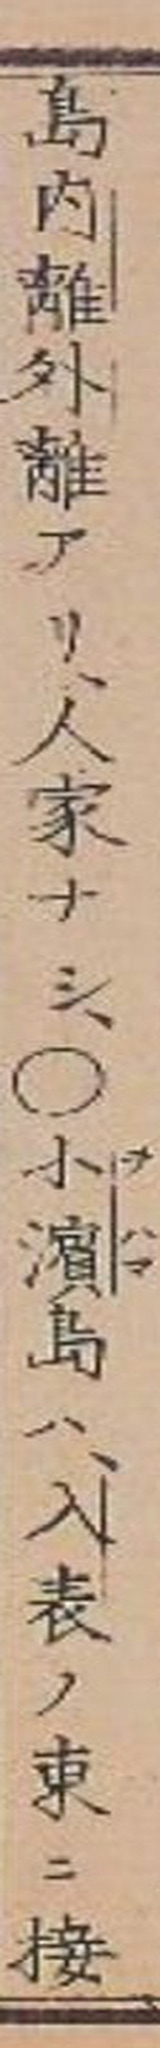島内離外離アリ、人家ナシ、○小浜島ハ、入表ノ東ニ接
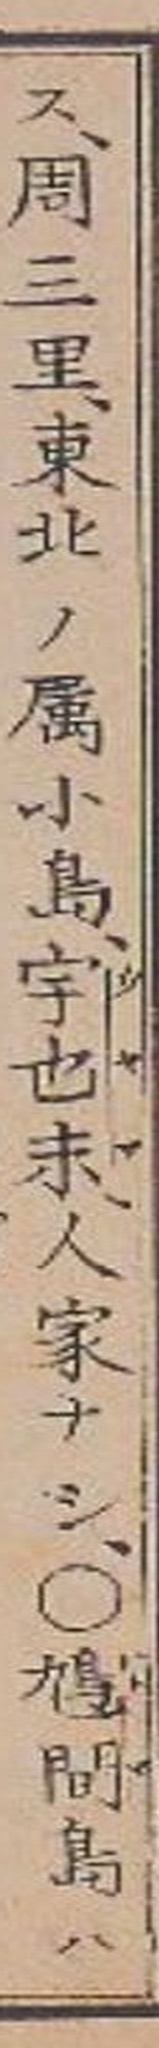ス、周三里、東北ノ属小島、宇也末、人家ナシ、○鳩間島ハ
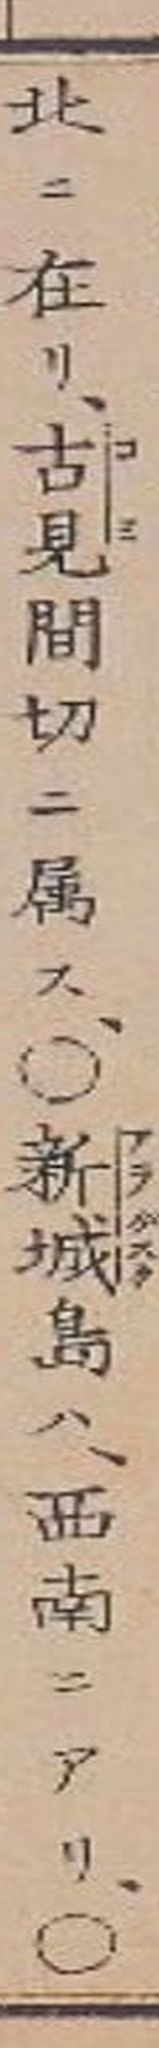北ニ在リ、古見間切ニ属ス、○新城島ハ、西南ニアリ、○
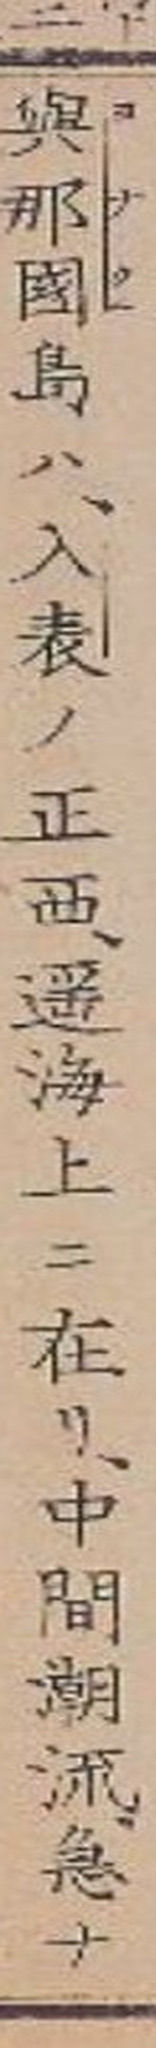与那国島ハ、入表ノ正西、遥海上ニ在リ、中間潮流、急ナ
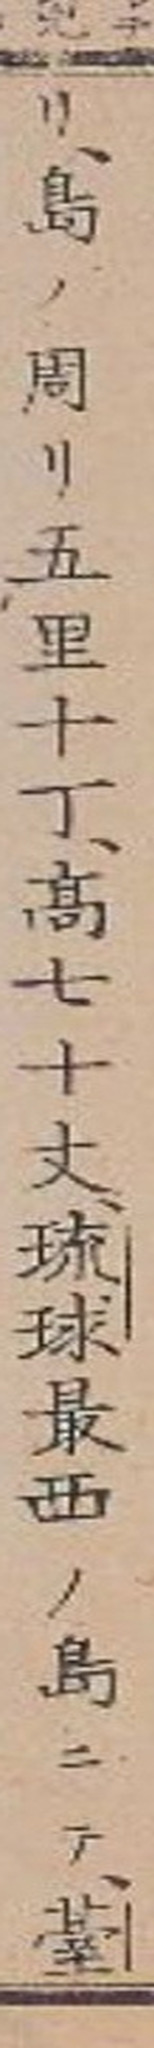リ、島ノ周リ五里十丁、高七十丈、琉球最西ノ島ニテ、台
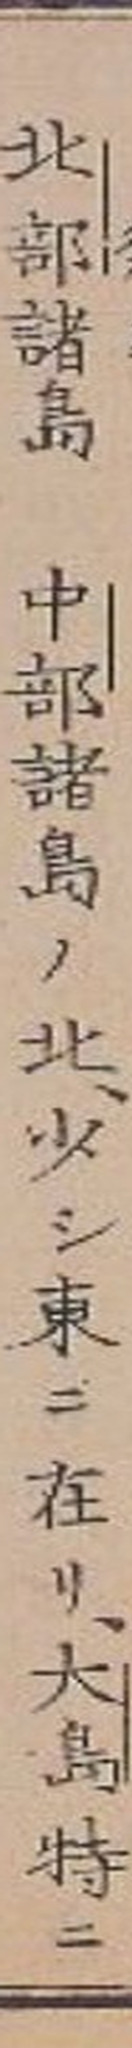北部諸島中部諸島ノ北、少シ東ニ在リ、大島特ニ
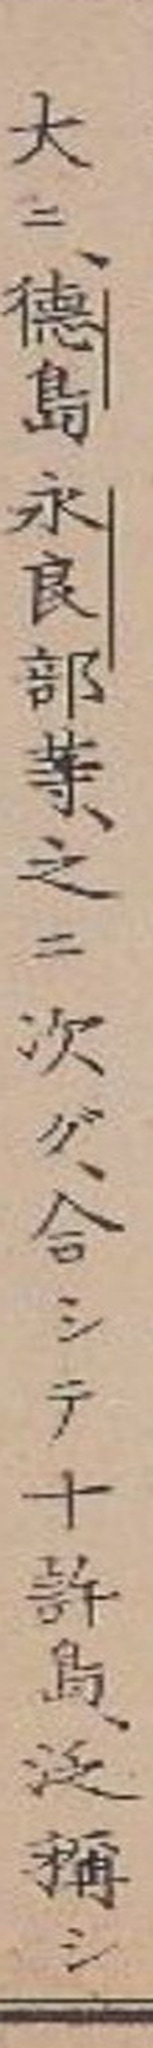大ニ、徳島永良部等、之ニ次グ、合シテ十許島、泛称シ
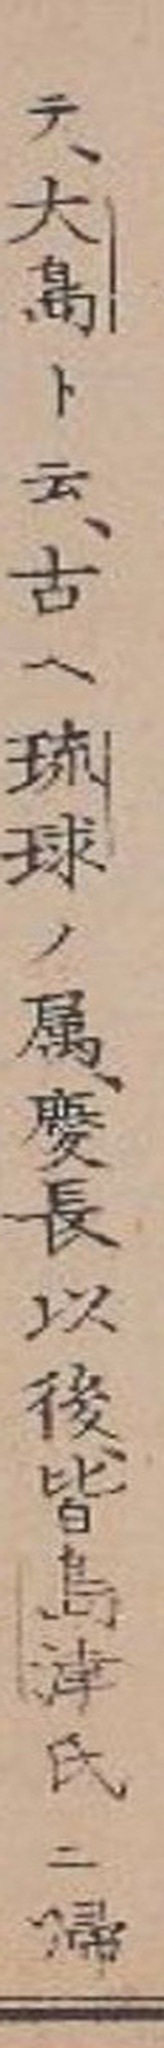テ、大島ト云、古ヘ琉球ノ属、慶長以後、皆島津氏ニ帰
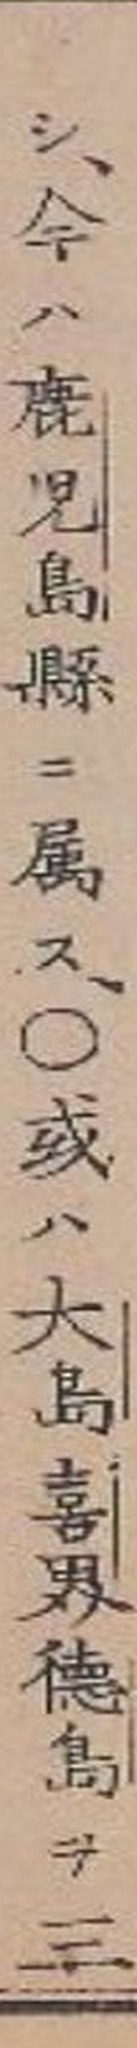シ、今ハ鹿児島県ニ属ス、○或ハ大島喜界徳島ヲ三
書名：琉球新誌 巻上
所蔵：University of the Ryukyus Library
